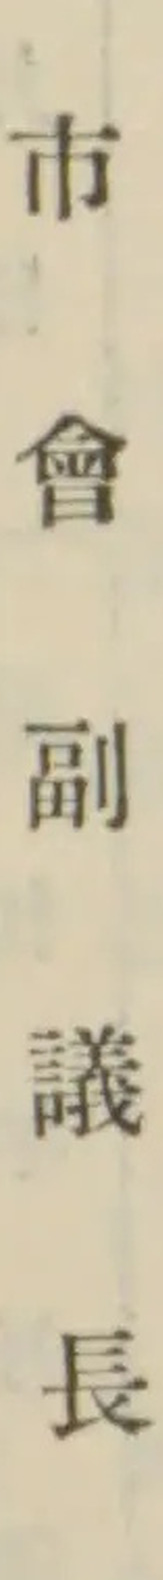市会副議長

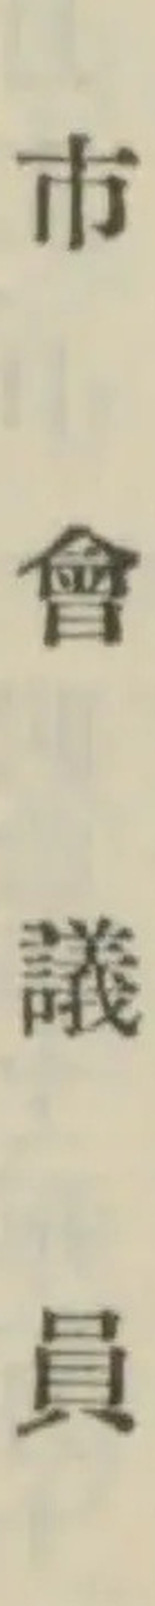市会議員
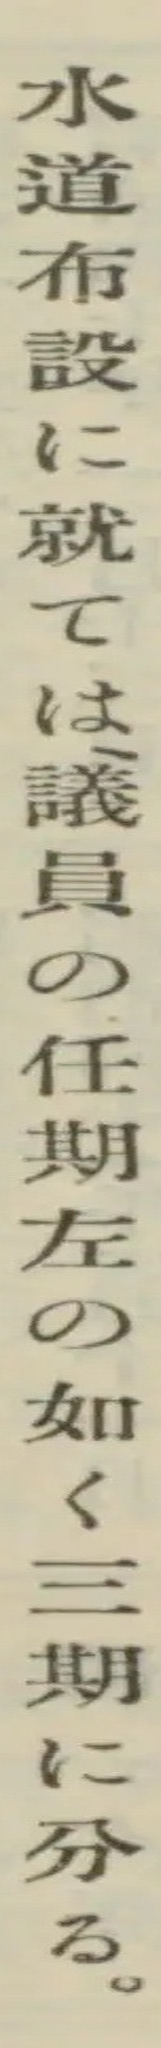水道布設に就ては、議員の任期左の如く三期に分る。
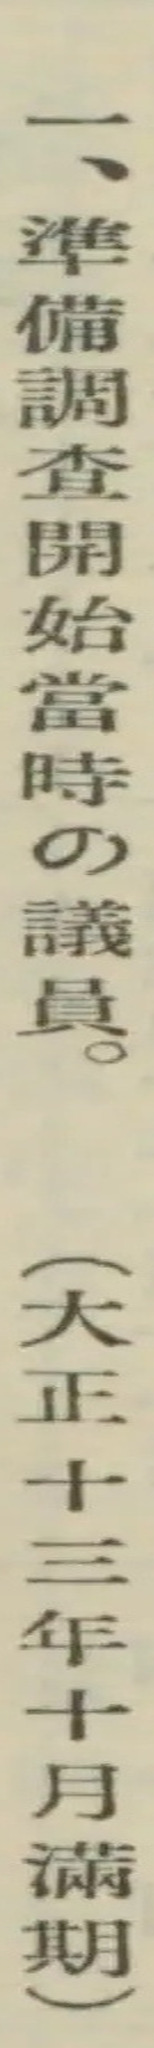一、準備調査開始当時の議員。(大正十三年十月満期)
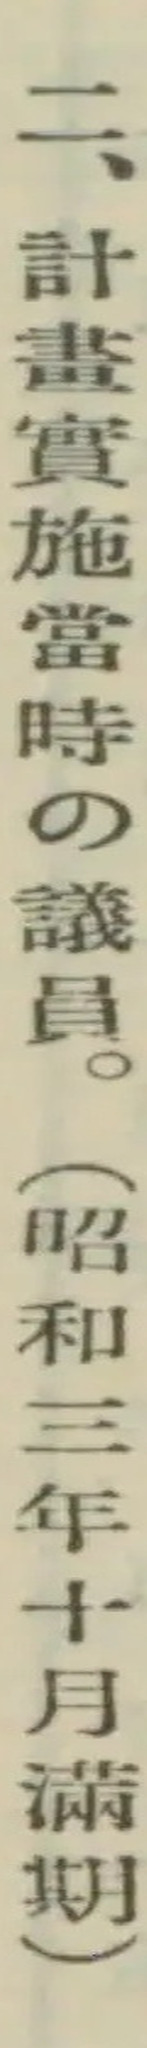二、計画実施当時の議員。(昭和三年十月満期)
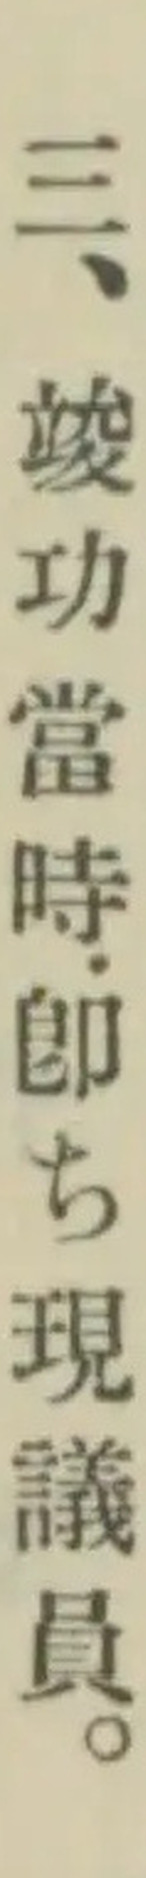三、竣工当時、即ち現議員。
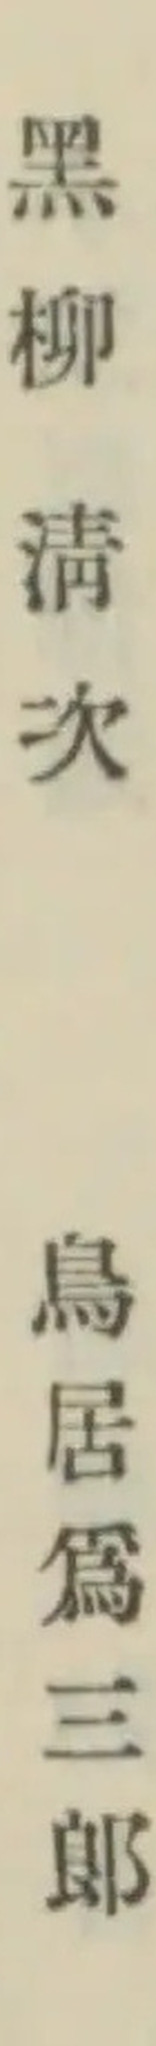黒柳清次鳥居為三郎
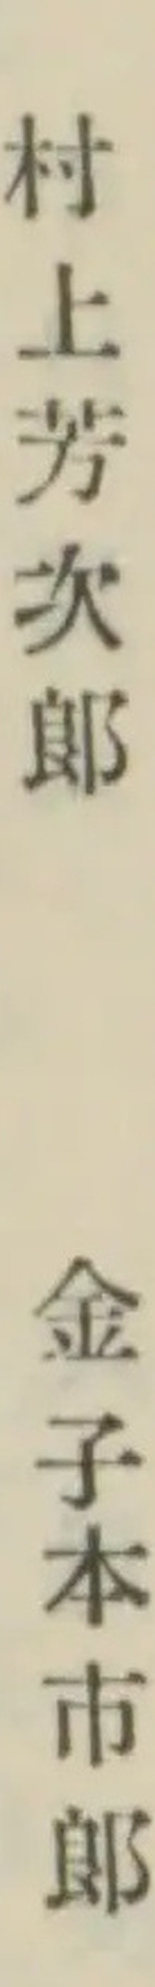村上芳次郎金子本市郎
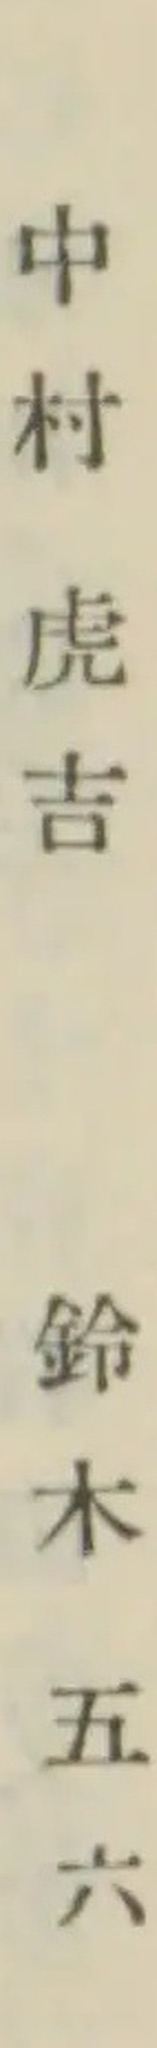中村寅吉鈴木五六

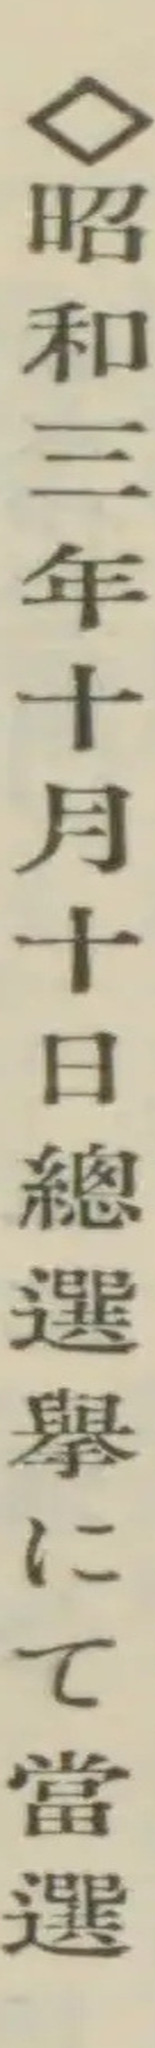◇昭和三年十月十日総選挙にて当選
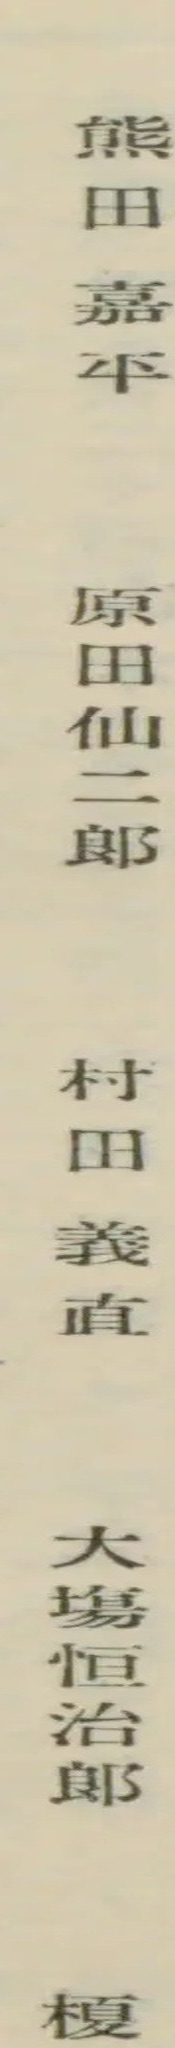熊田嘉平原田仙二郎村田義直大場恒治郎
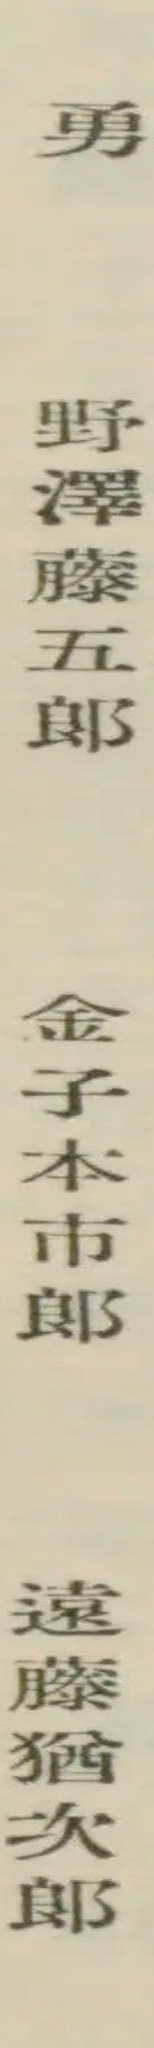大林勇野澤藤五郎金子本市郎遠藤猶次郎
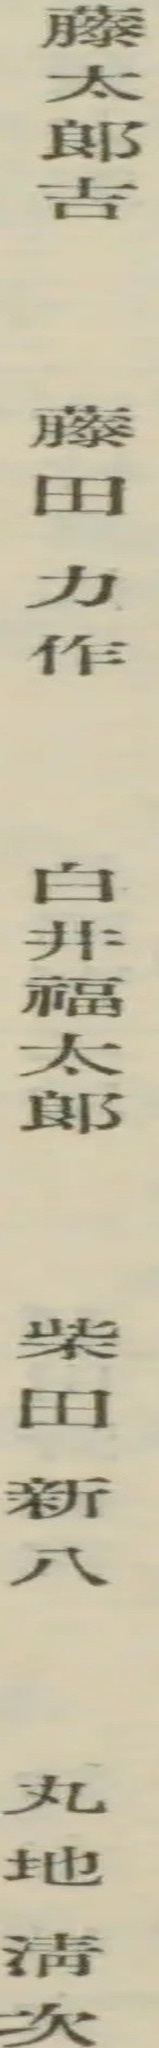内藤太郎吉藤田力作白井福太郎柴田新八
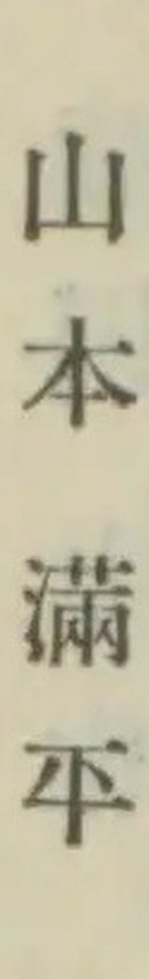山本満平
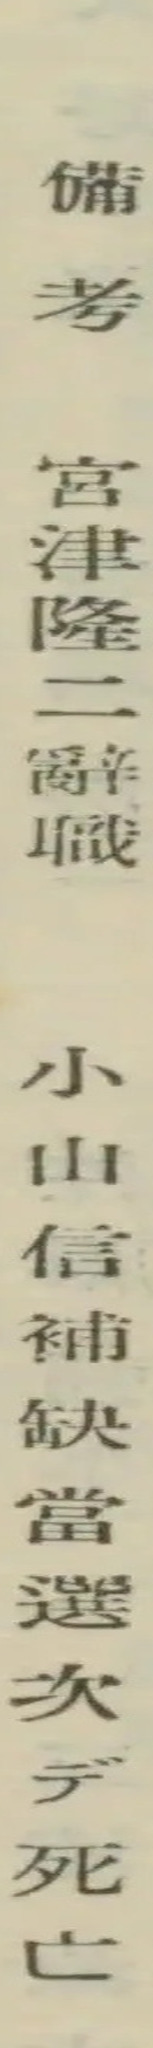備考宮津隆二辞職小山信補欠当選次で死亡
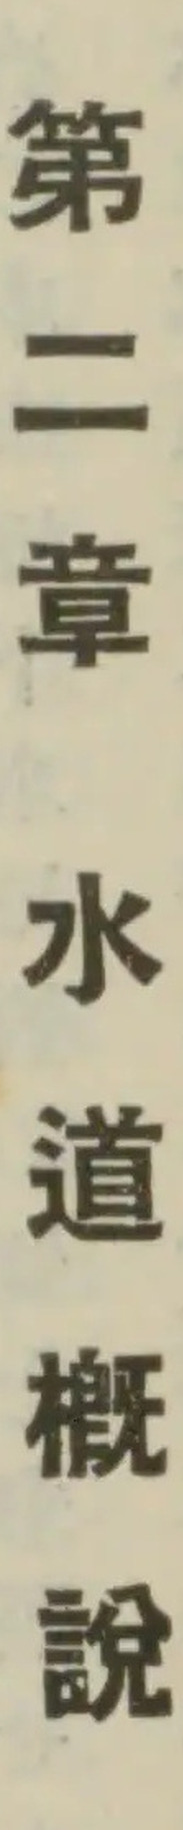第二章水道概説
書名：豊橋市水道誌
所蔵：国立国会図書館 National Diet Library, JAPAN
